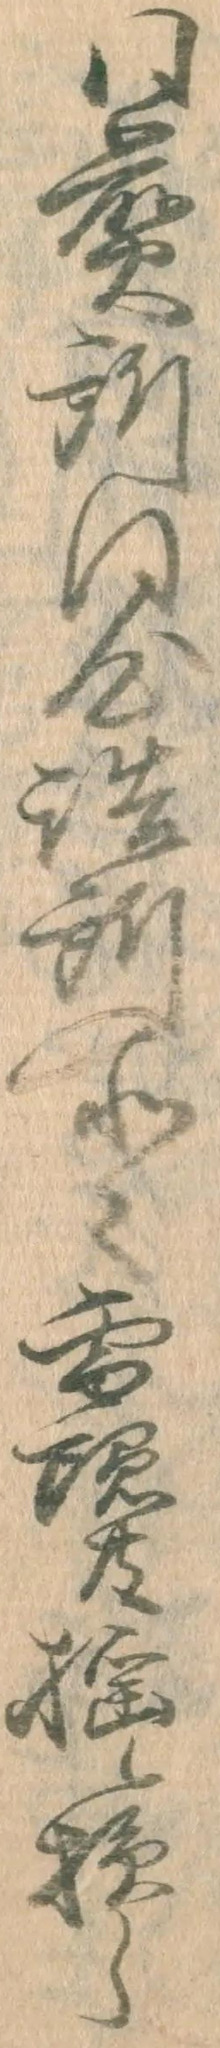同煎所同心詰所所〻雪隠共揺レ損候
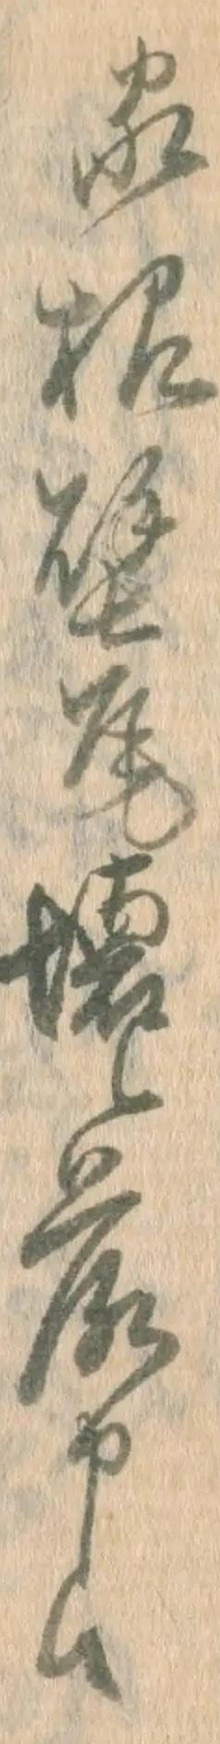家根壁瓦壊レ落申候
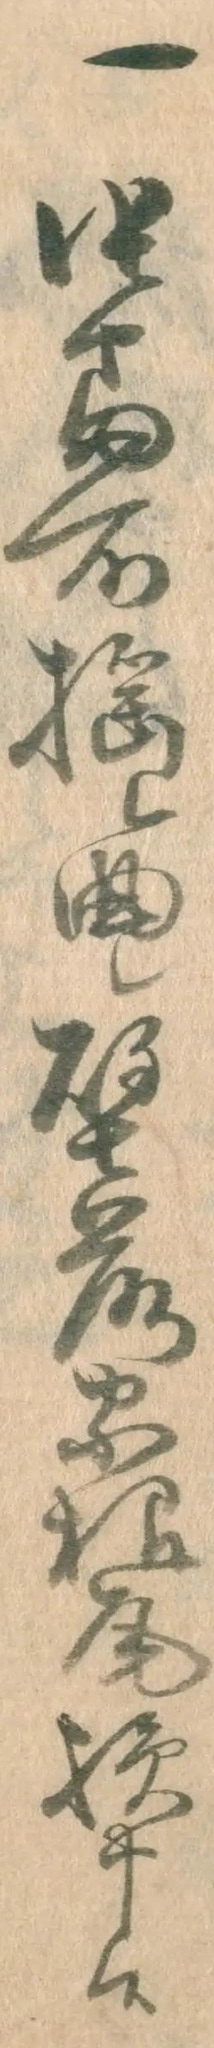一張番所揺レ曲レ壁落家根瓦損申候
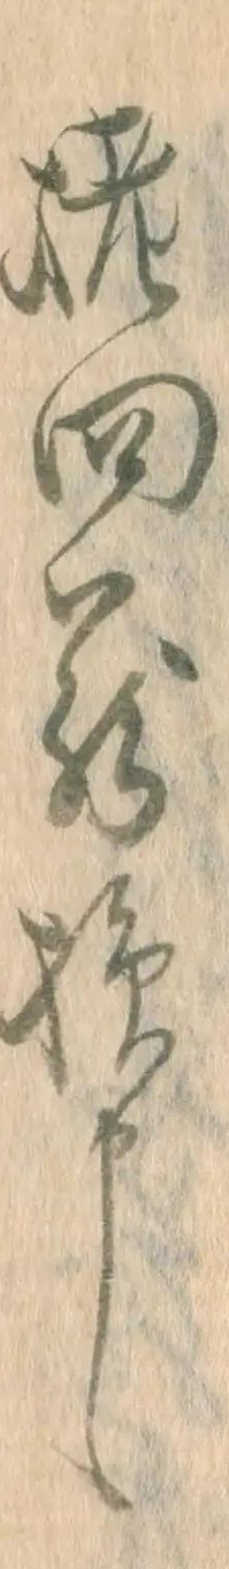一拷問蔵損申候

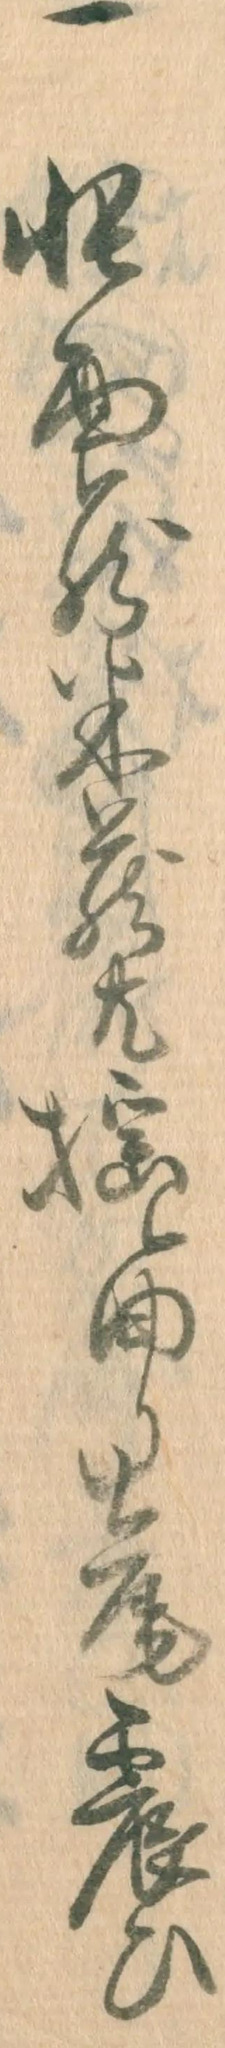一帳面蔵米蔵共揺レ曲り土瓦震ひ
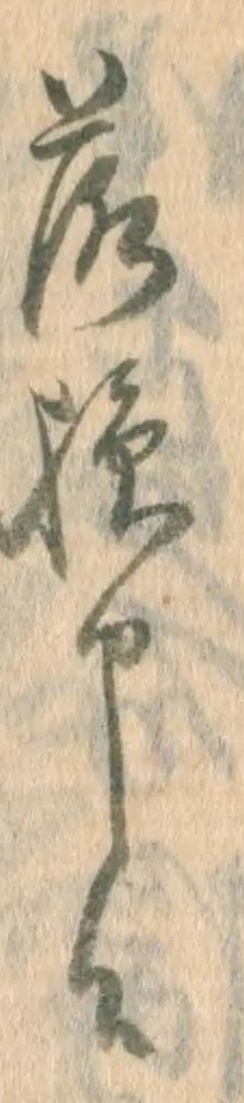落損申候
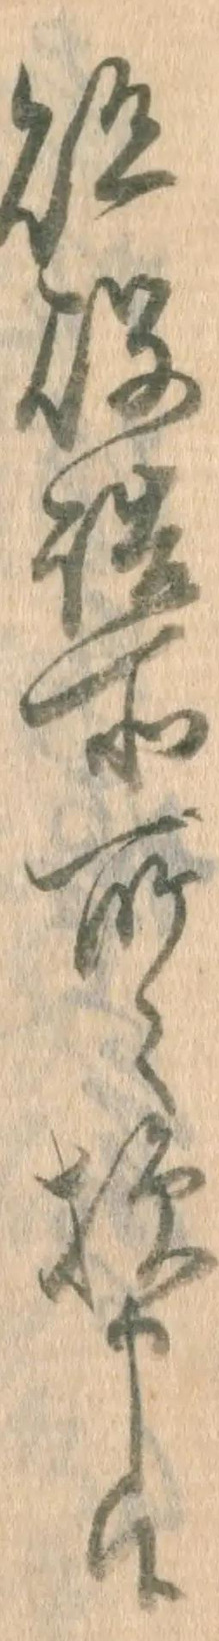一賄役詰所所〻損申候
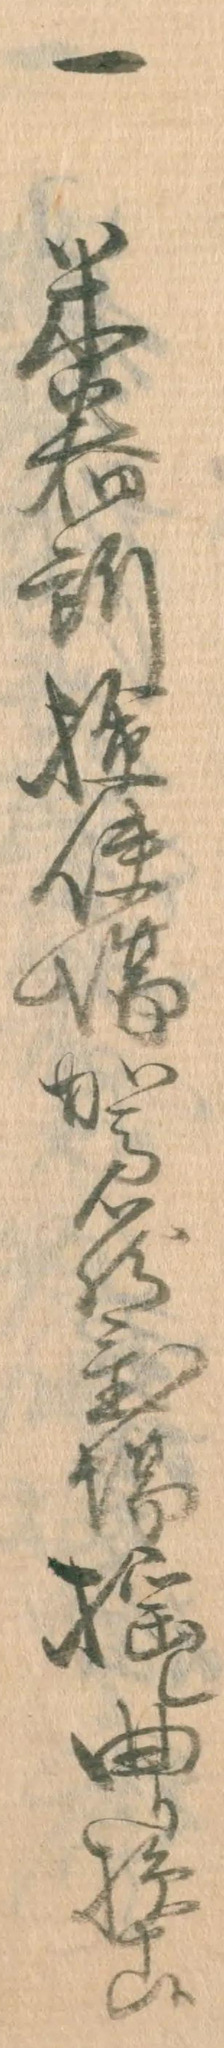一米舂所検使場駕籠置場揺レ曲り損申候
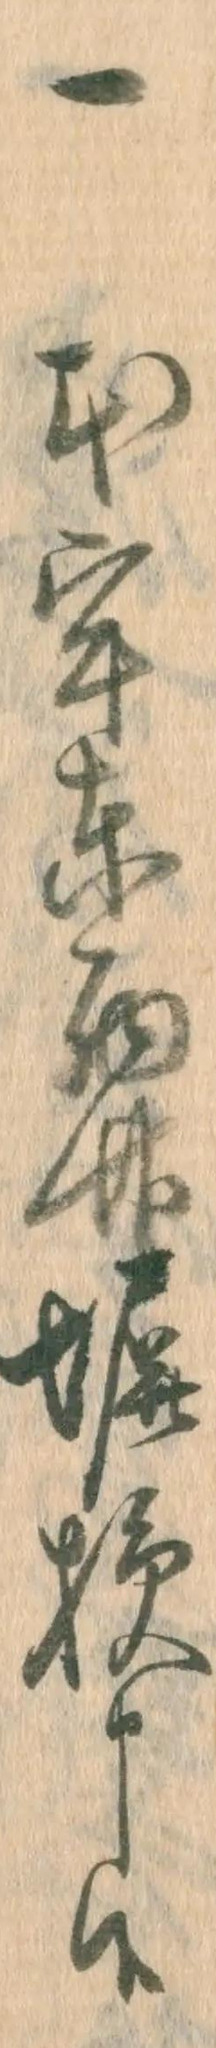一本牢東西竹塀損申候
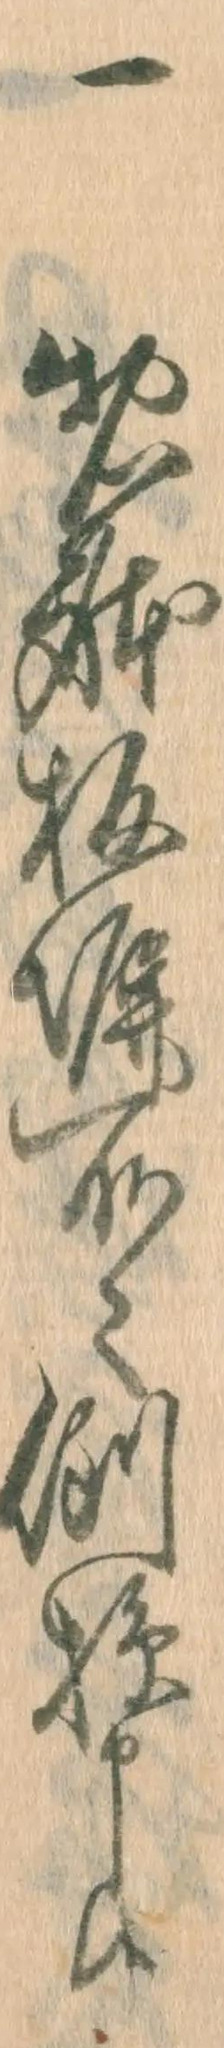一惣体板塀所〻倒損申候
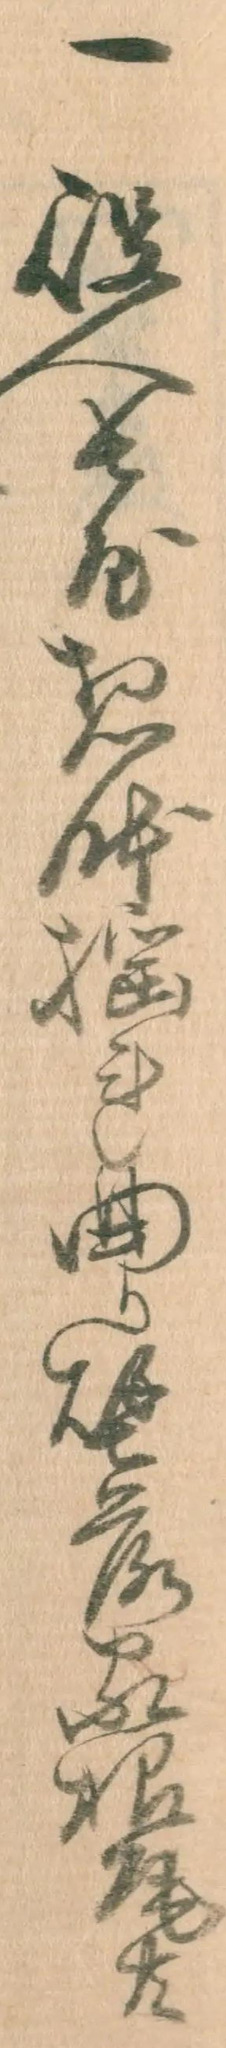一役人長屋惣体揺れ曲り壁落家根瓦共
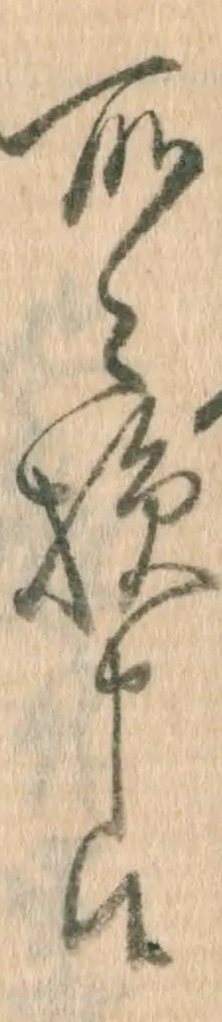所〻損申候
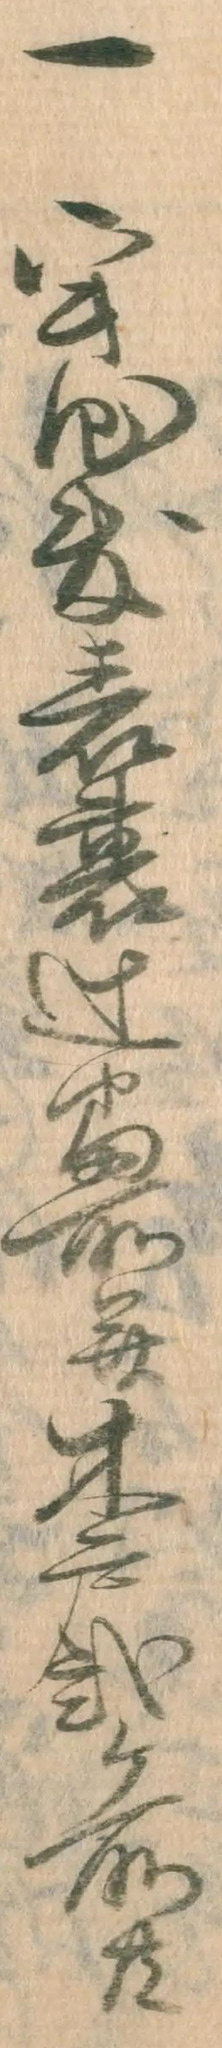一牢屋敷表裏辻番所幷木戸弐ケ所共
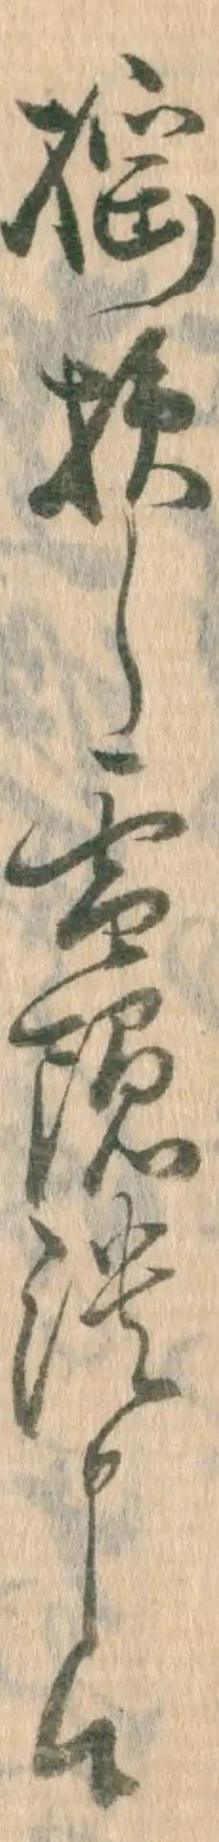揺損し雪隠潰申候
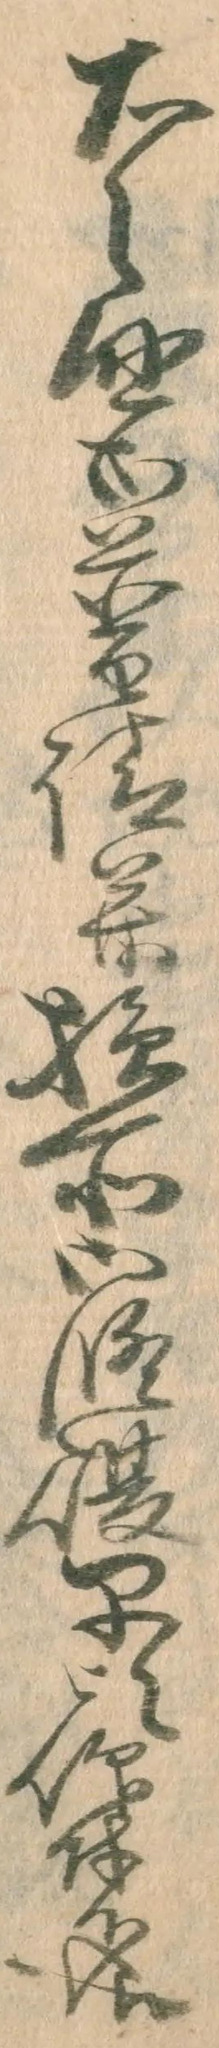右之通御普請幷損所御修復早〻被仰付下様
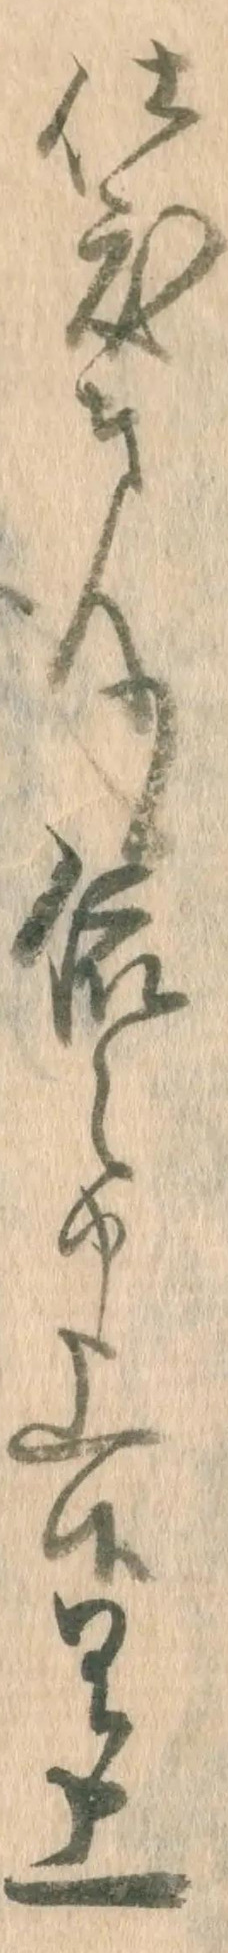仕度奉存候依之申上候已上
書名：七十冊物類集 71巻. [44] 四十三 牢屋敷御普請御修覆地震ニ付骨折候牢屋掛御褒美之部
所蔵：国立国会図書館 National Diet Library, JAPAN
